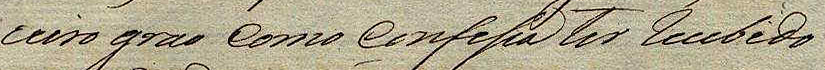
ceiro grao como confessa ter recebido
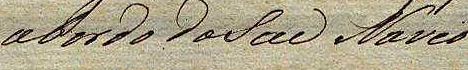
a bordo do seu Navio.
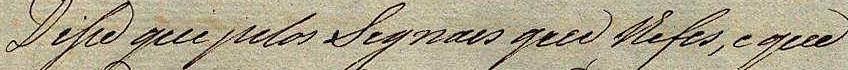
Disse que pelos Segnaes que lhe fes, e que
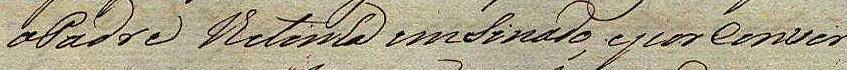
o Padre lhe tinha emsinado, e por conver
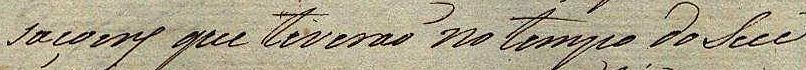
saçoens que tiveraõ no tempo do seu
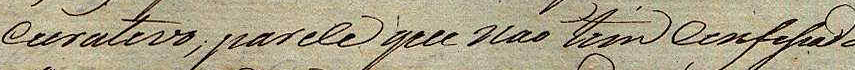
curativo, parece que nao tem confessado
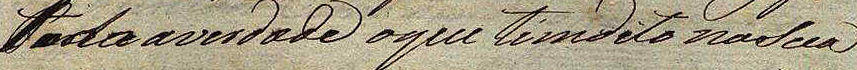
toda a verdade o que tem dito na sua
